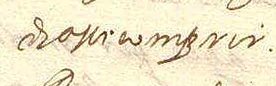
de assi comprir.
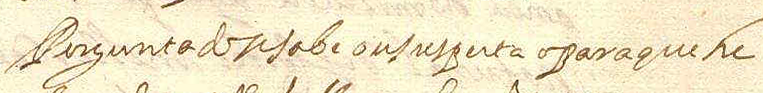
Perguntado se sabe ou suspeita o para que he
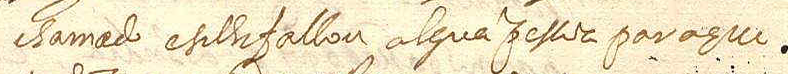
chamado e se lhe fallou alguā pessoa para que
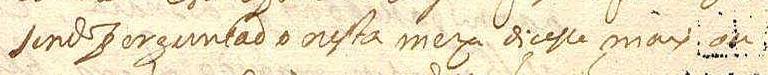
sendo perguntado nesta meza dicesse mais ou
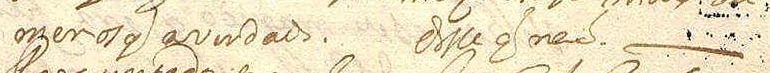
menos q̄ a verdade. disse q̄ naõ
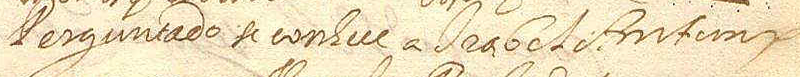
Perguntado se conhece a Izabel Antunes
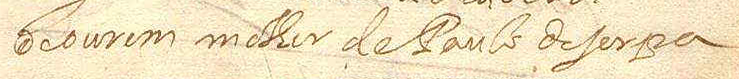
de ourem molher de Paulo de serpa
